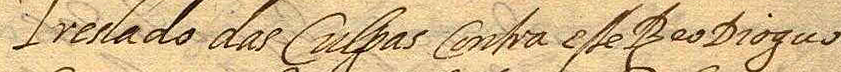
Treslado das Culpas Contra este Reo Dioguo
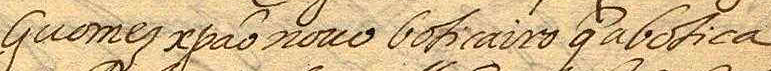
Guomez xpaõ nouo boticario q̄ a botica
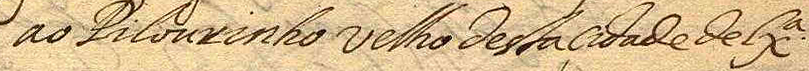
ao Pilourinho velho desta çidade de lxa.
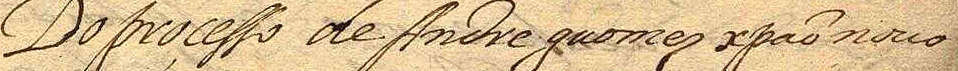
Do proçesso de Andre guomez xpaõ nouo
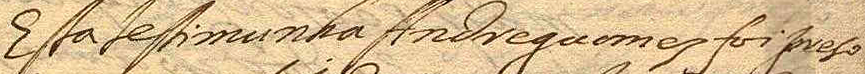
Esta testimunha Andre guomez foi preso
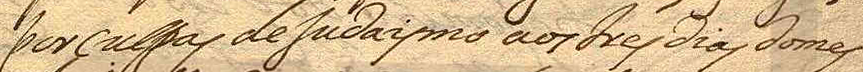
por culpas de Judaismo aos tres dias do mes
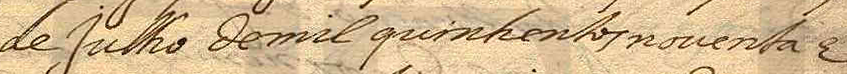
de Julho de mil quinhentos nouenta E
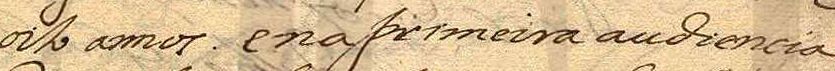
oito annos. e na primeira audiençia
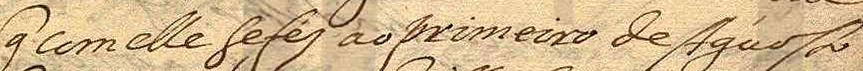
q̄ com elle se fez ao primeiro de Aguosto
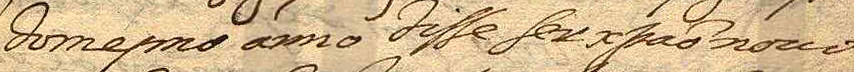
do mesmo anno disse ser xpaõ nouo
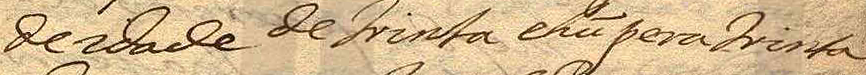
de idade de trinta e hū pera trinta
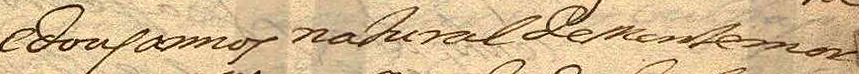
e dous annos natural de montemor
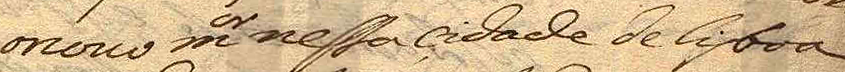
o nouo mor nesse çidade de lisboa
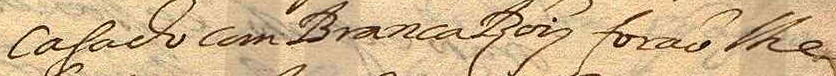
casado com Branca Roīz foraõ lhe
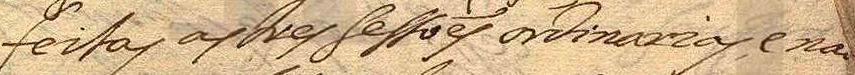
feitas as tres sessões ordinarias, e na
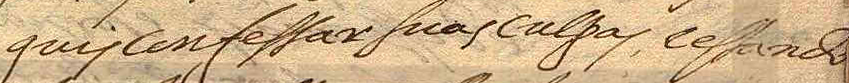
quis confessar suas culpas, e estando
